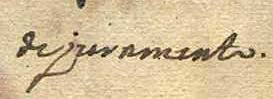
de juramento.
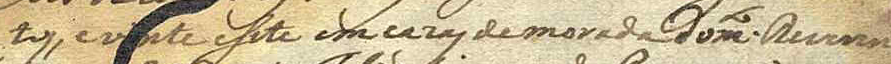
tos, e vinte e sete em cazas de morada do m.to Reveren
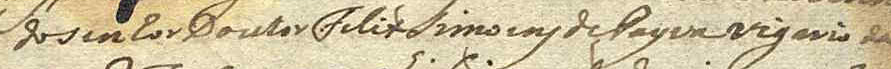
do senhor Doutor Felix Simoens de Payva vigario da
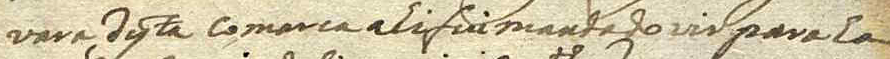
vara desta comarca ahi fui mandado vir para ha
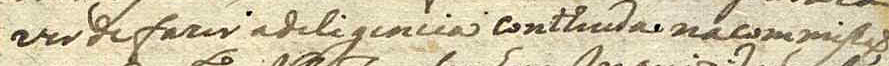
ver de fazer a deligencia contheuda na commissaõ
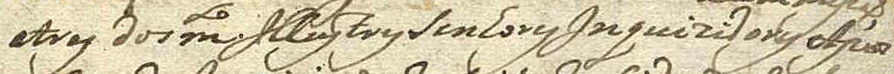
atras dos mto. Jllustres Senhores Jnquizidores Apos
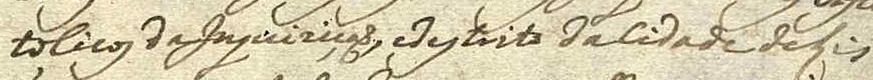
tolicos da Jnquiziçaõ, e destrito da Cidade de Lis
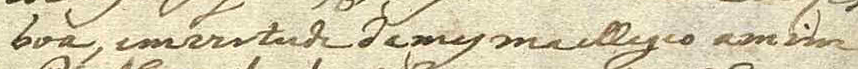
boa, em virtude da mesma ellegeo a mim
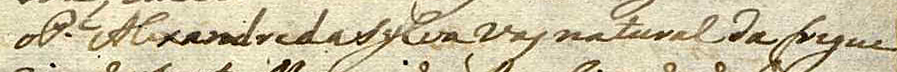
o P.e Alexandre da Sylva Vas natural da fregue
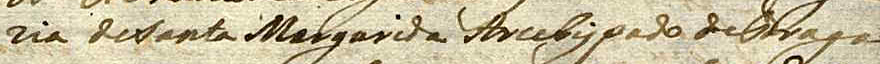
zia de santa Margarida Arcebispado de Braga
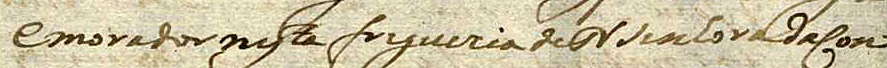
e morador nesta freguezia de N Senhora da Con
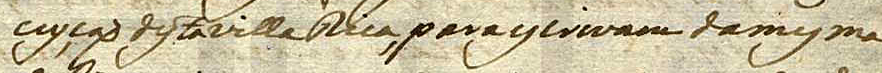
ceyçaõ desta villa Rica, para escrivam da mesma
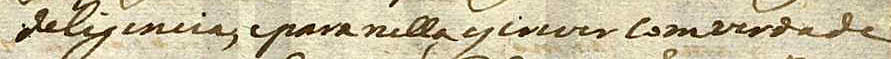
deligencia, e para nella escrever com verdade
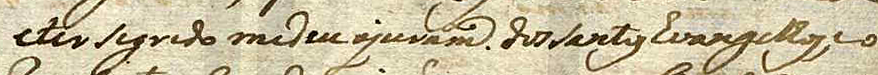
e ter segredo me deu o juram.to dos santos Evangelhos, e o
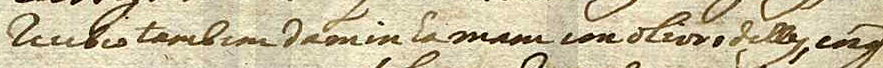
Recebeo tambem da minha mam em o livro delles, en q̄
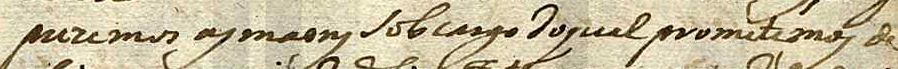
puzemos as maons sob cargo do qual prometemos de
